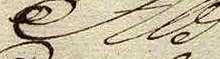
Aos
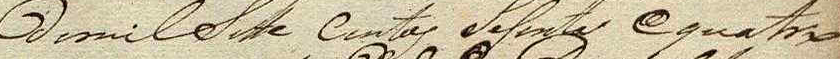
de mil Settecentos sesenta e quatro
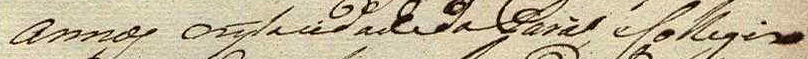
annos nesta cidade do Pará, e Collegio
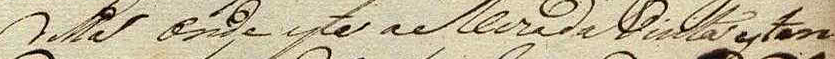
della onde esta a Mesa da Visita estan
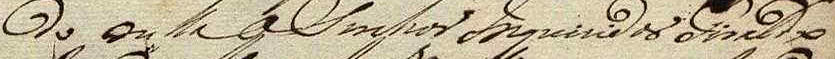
do nella o Senhor Inquizidor Giraldo
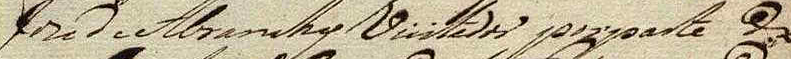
Joze de Abranches Visitador por parte do
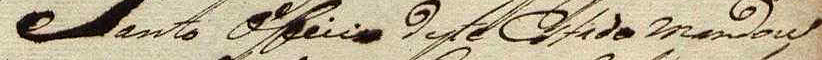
Santo Officio deste Estado mandou
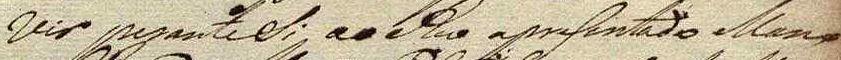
vir perante Si ao Reo apresentado Mano
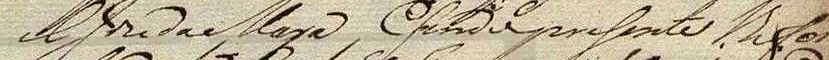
el Joze da Maya e sendo presente lhe foi
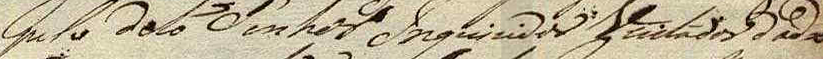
pelo deto Senhor Inquisidor Visitador dado
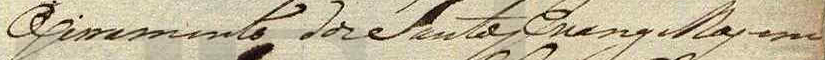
O juramento doz Santos Evangelhos em
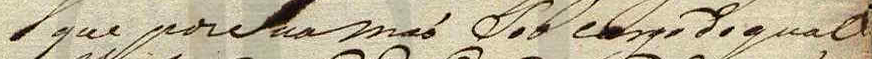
que poz Sua maõ Sob cargo do qual
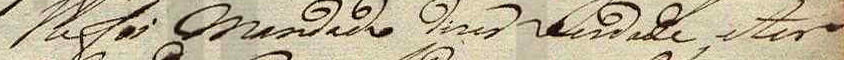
lhe foi mandado dizer verdade, e ter
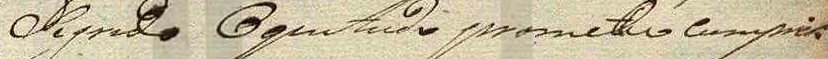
segredo O que tudo prometeo cumprir
